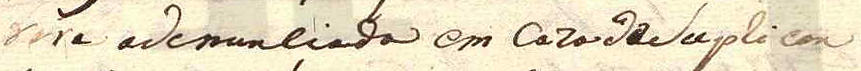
rara a denunçiada em caza da suplican
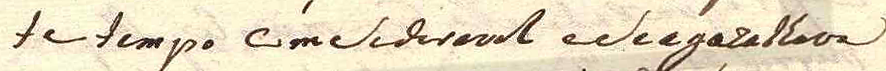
te tempo comsederavel e se agazalhava
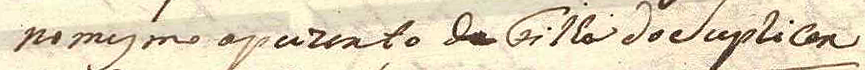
no mesmo apuzento da Filha do Suplican
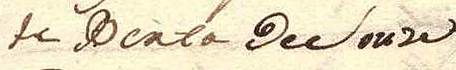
te Bento de Souza
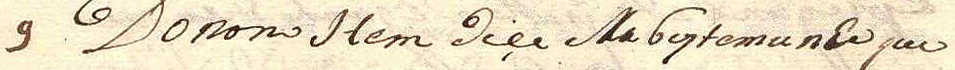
9 Do nono Item diçe ella testemunha que
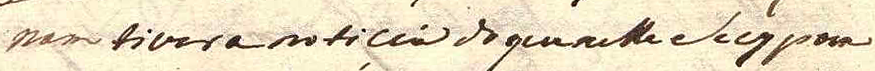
nam tivera notiçia do que nelle se espoem
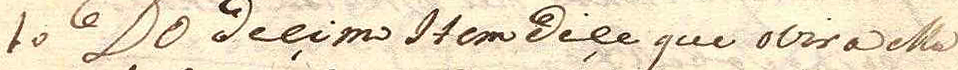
10 Do deçimo Item diçe que ovira ella
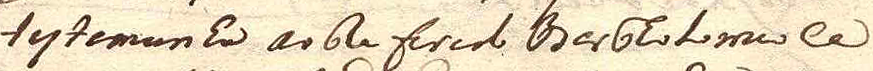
testemunha ao Referido Bertholomeo ca
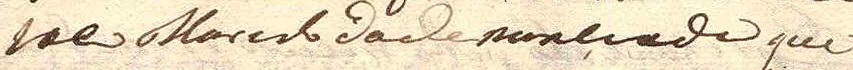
vaco Marido da denunçiada que
